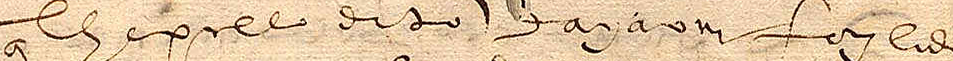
q̄ lhe pello dito dayaom foy lido
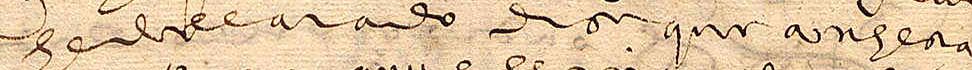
he decllarado dise que conhesia
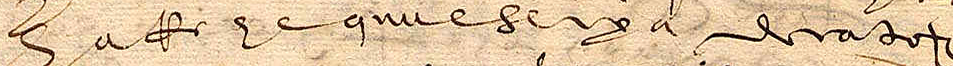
ha Re he quue serya de cator
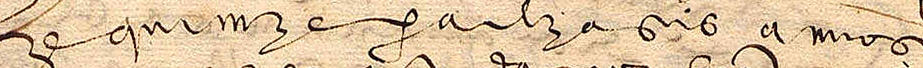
ze quimze ꝑa dezaseis annos
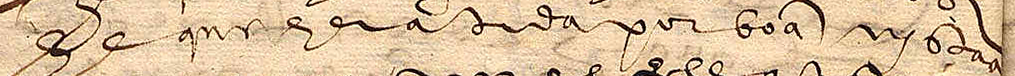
he que hera tida por boa crjstaa
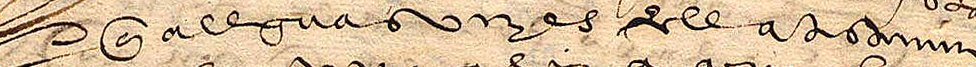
e q̄ allguas vezes ella testemu
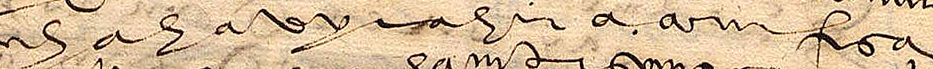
nha ha vyra hir a comfesar
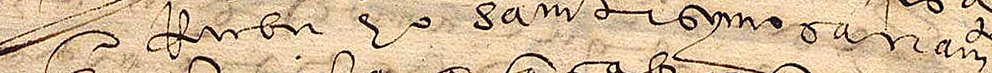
e Receber ho samtisymo sacramto
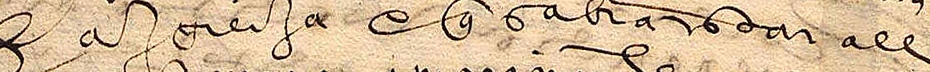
ha JgreiJa e q̄ sabia estar all
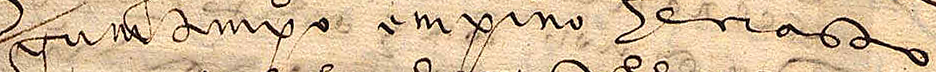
gum tempo em pino he crasto
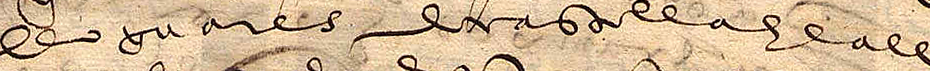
lloguares de castella he all
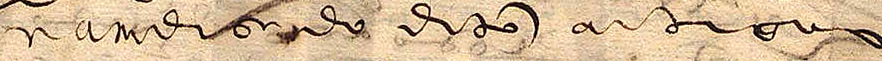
nam dise do dito artiguo
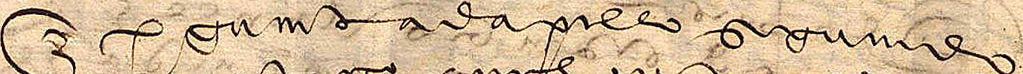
item ꝑgumtada pello segumdo
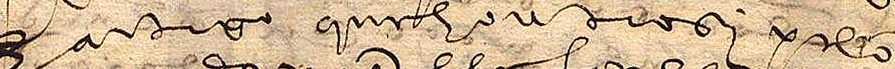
hartigo que houtrosy pelo
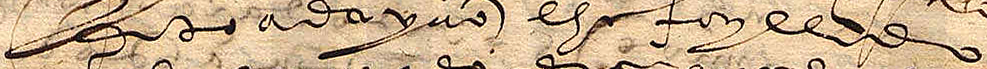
dito adayaõ lhe foy llido
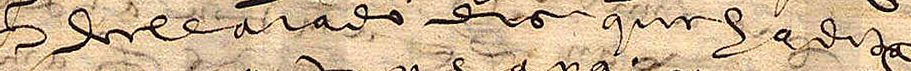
e decllarado dise que ha dita
